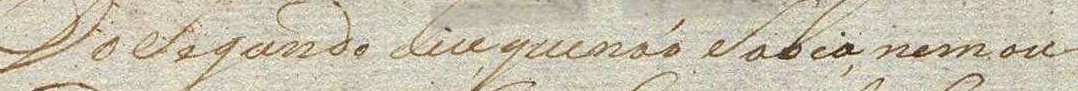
Do Segundo dice, que não Sabia, nem ou
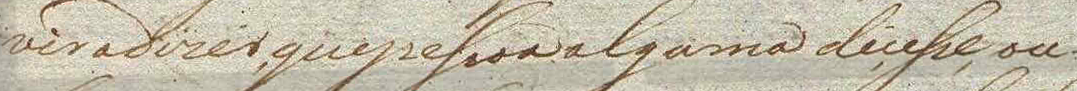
vira dizer, que pessoa alguma diçesse, ou
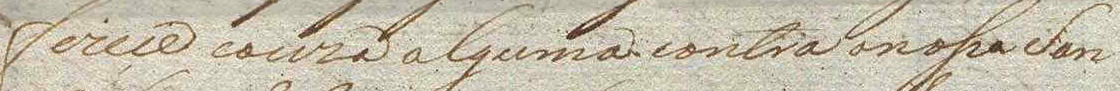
fizeçe couza alguma contra a nossa San
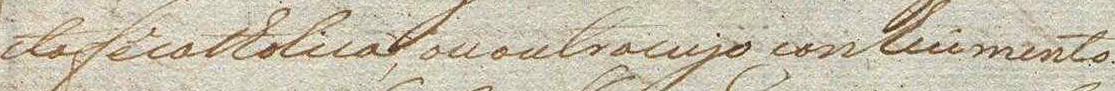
ta fê catholica, ou outra cujo conhecimento
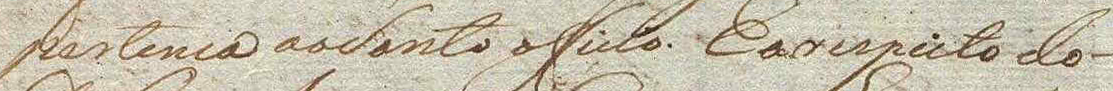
pertença ao Santo offiçio. E a respeito do
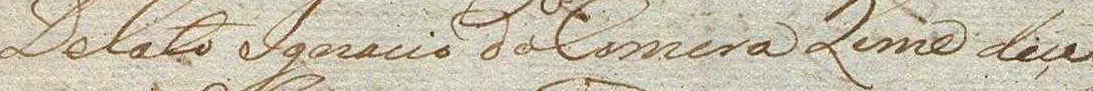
Delato Ignacio da Camera Leme diçe
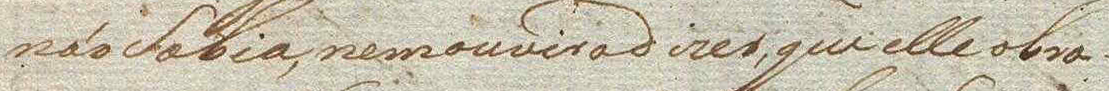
não Sabia, nem ouvira dizer, que elle obra
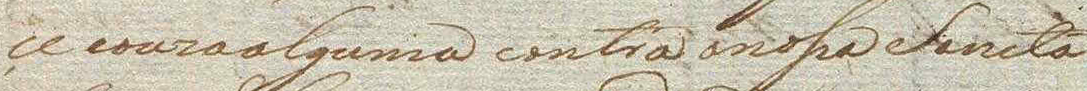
çe couza alguma contra a nossa Sancta
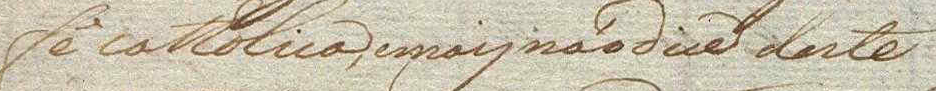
fê catholica, e mais não dice deste
